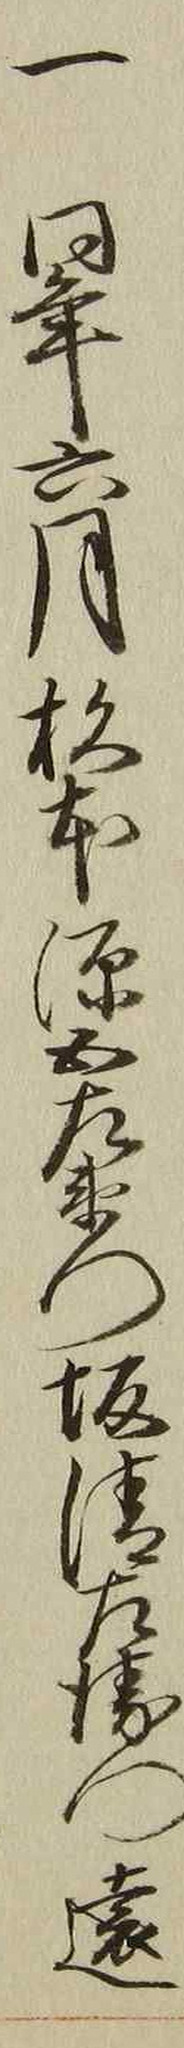一同年六月杉本源五左衛門坂清左衛門遠
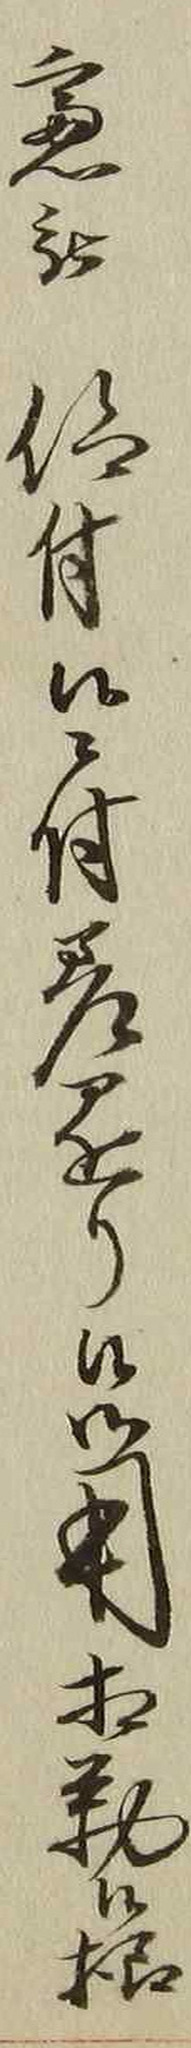慮被仰付候ニ付差懸り候御用相勤候様
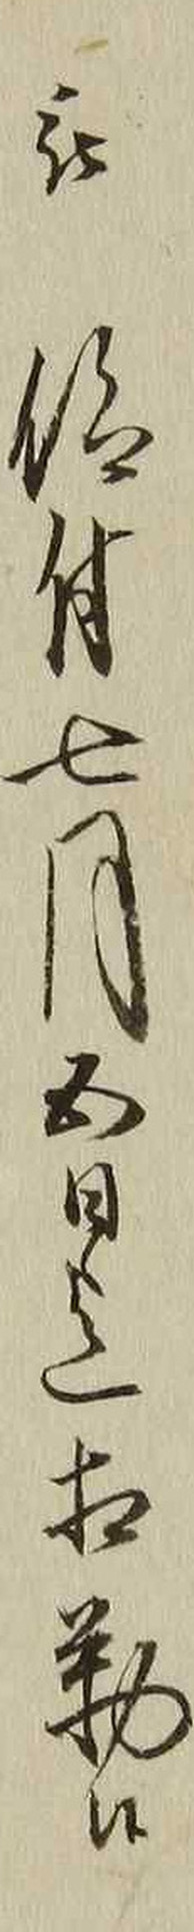被仰付七月五日迄相勤候
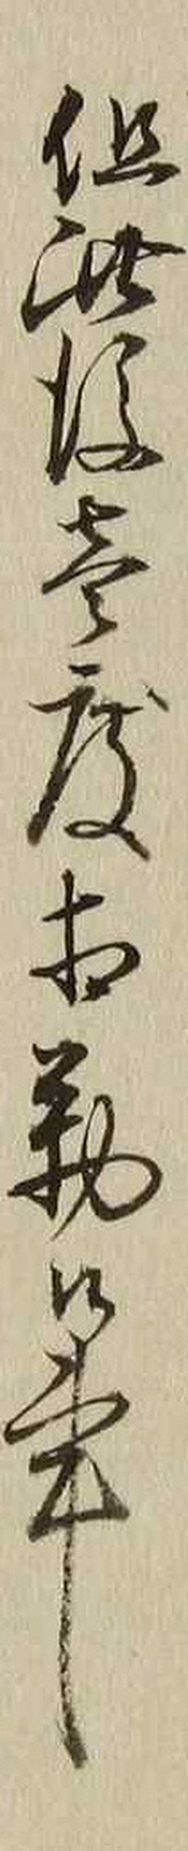但此後壱度相勤候事
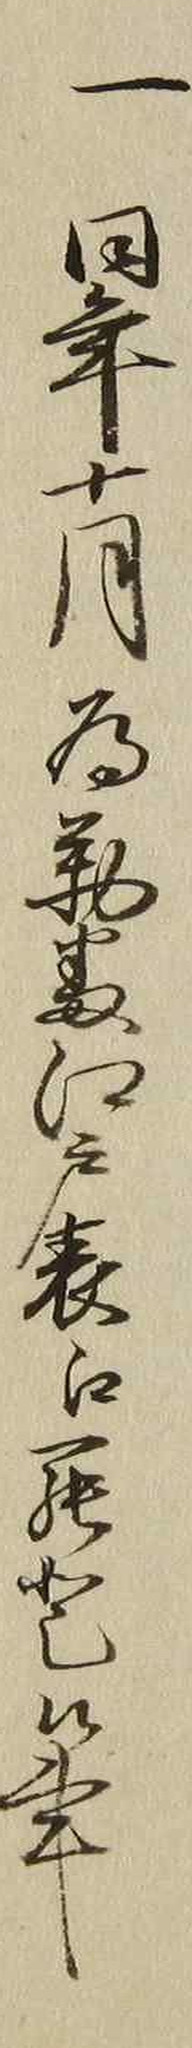一同年十月為勤番江戸表江罷登候事
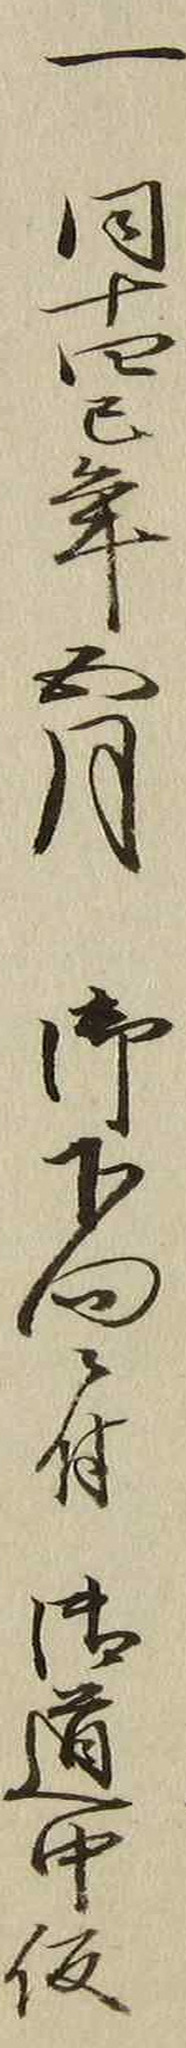一同十四巳年五月御下向ニ付御道中仮
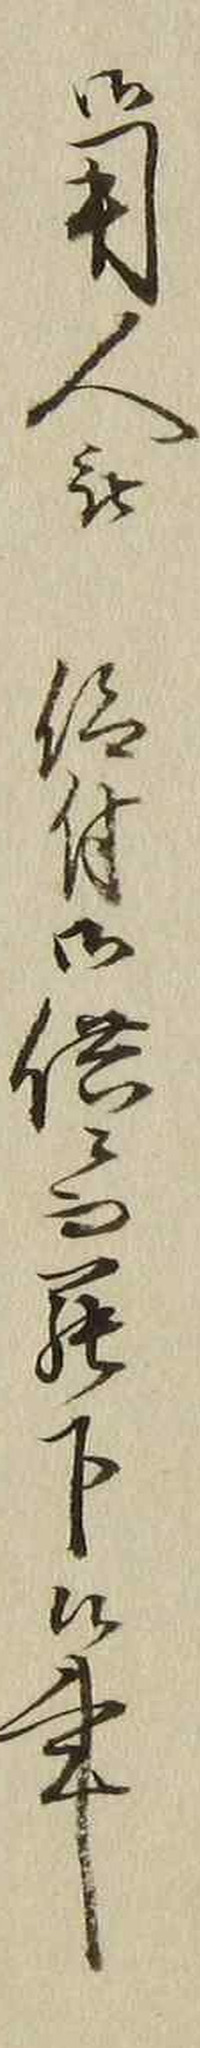御用人被仰付御供ニ而罷下候事
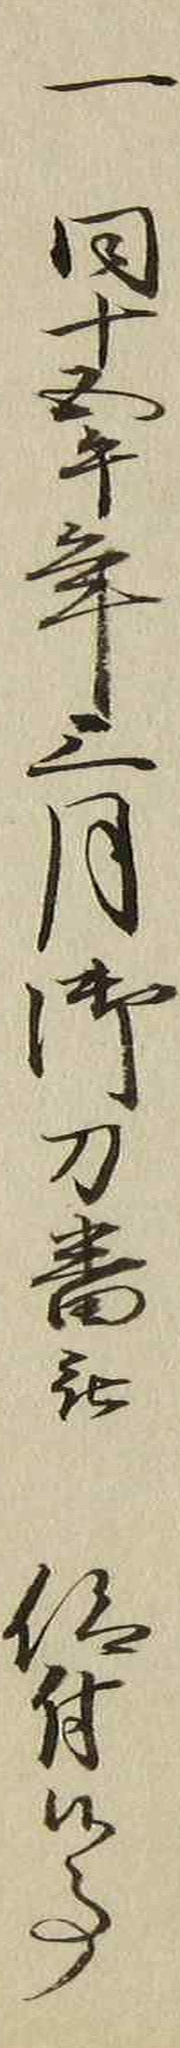一同十五午年三月御刀番被仰付候事
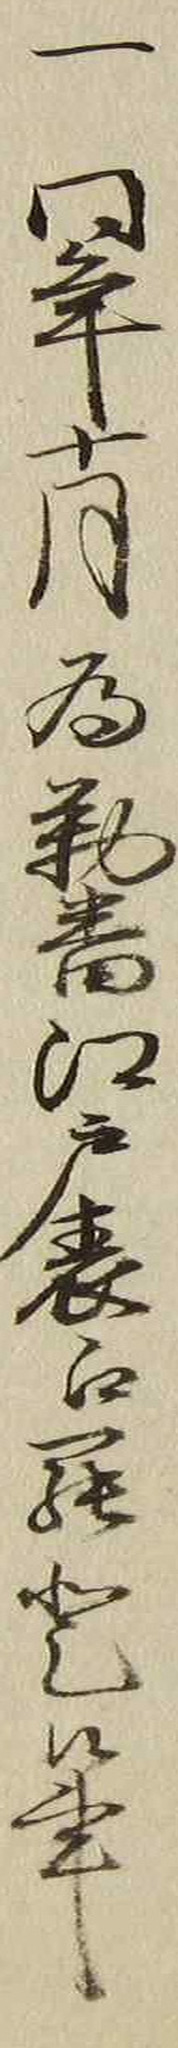一同年十月為勤番江戸表江罷登候事
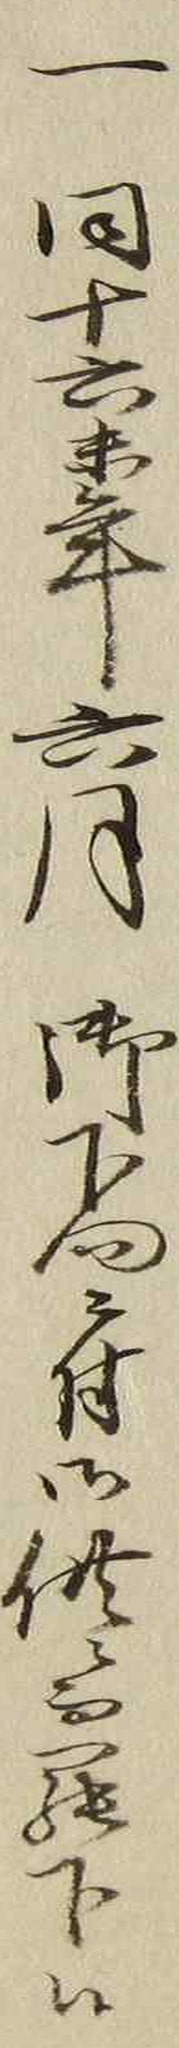一同十六未年六月御下向ニ付御供ニ而罷登候
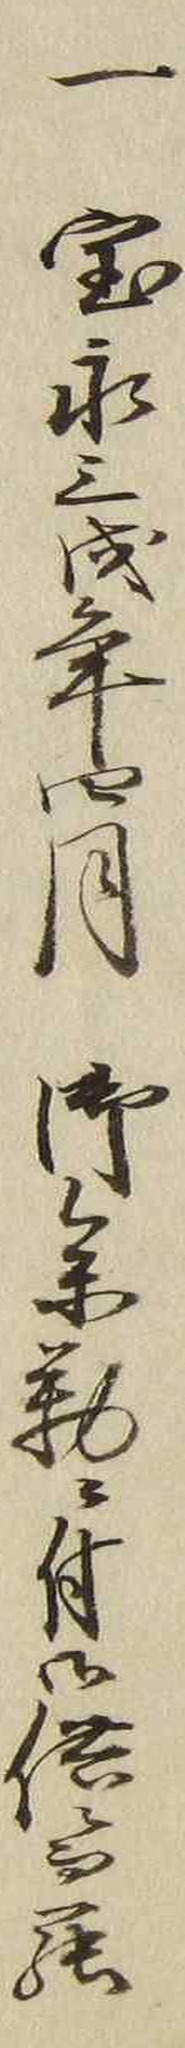一宝永三戌年四月御参勤ニ付御供ニ而罷
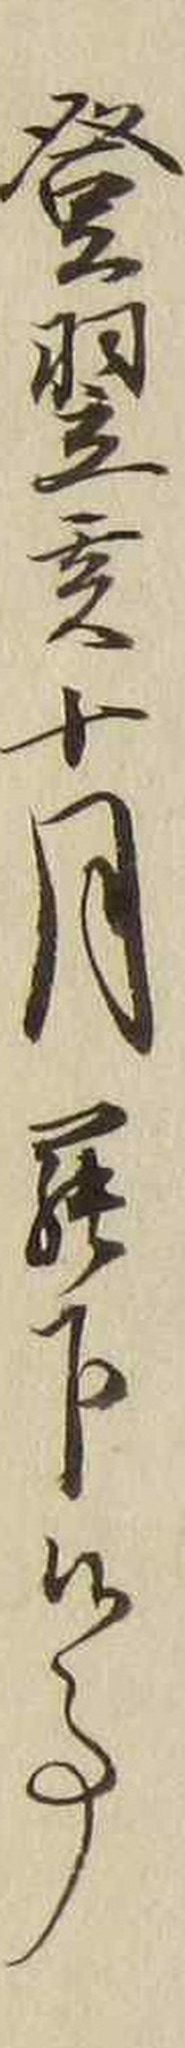登翌亥十月罷下候事

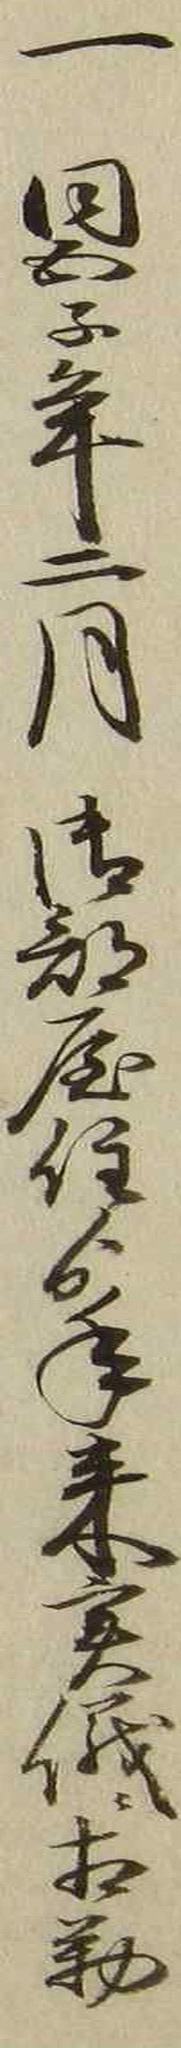一同五子年二月御部屋住ゟ年来実儀ニ相勤
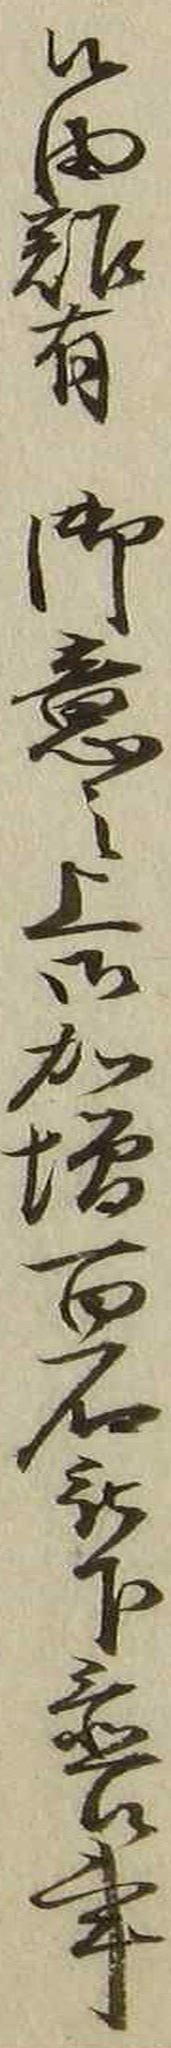候由難有御意之上御加増百石被下置候事
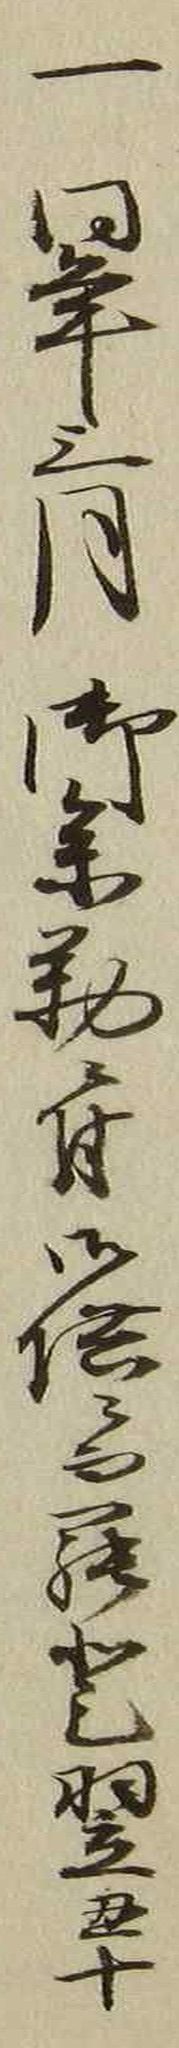一同年三月御参勤ニ付御供ニ而罷登翌丑十
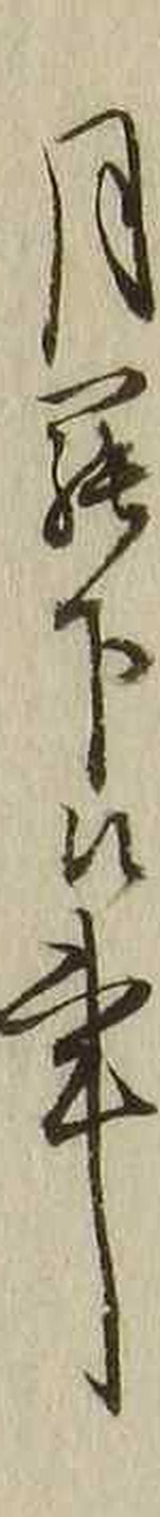付罷下候事
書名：諸士系譜　巻之114　か之部22
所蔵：会津若松市立会津図書館
